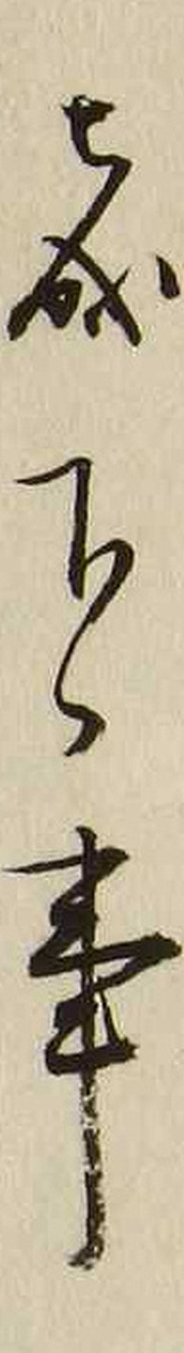被成下候事
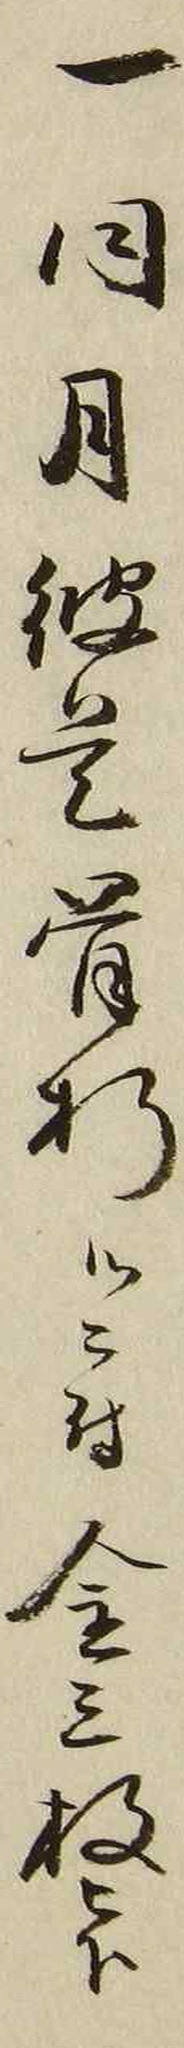一同月彼是骨折候ニ付金三枚被下
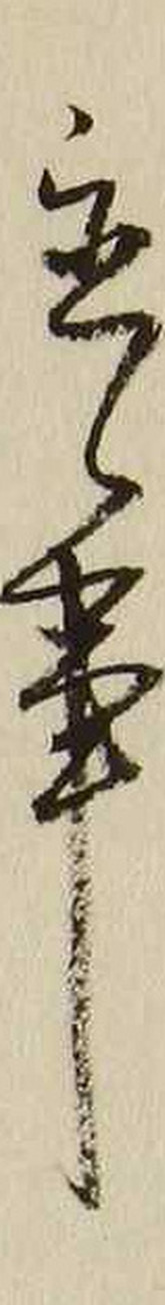置候事
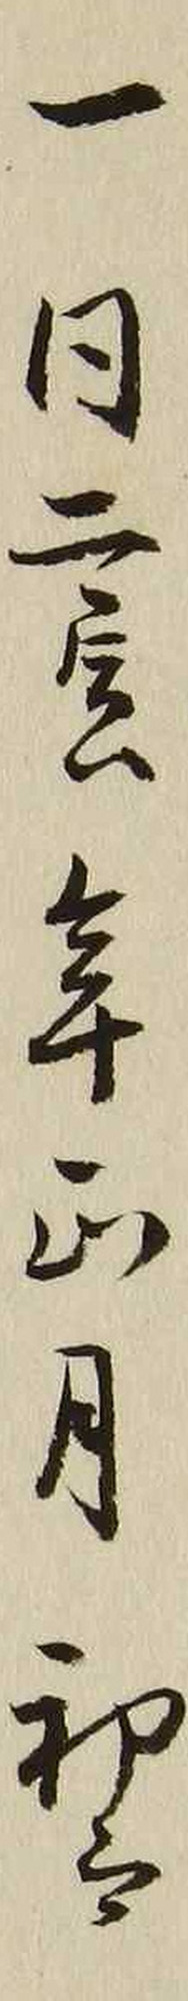一同二寅年正月初而
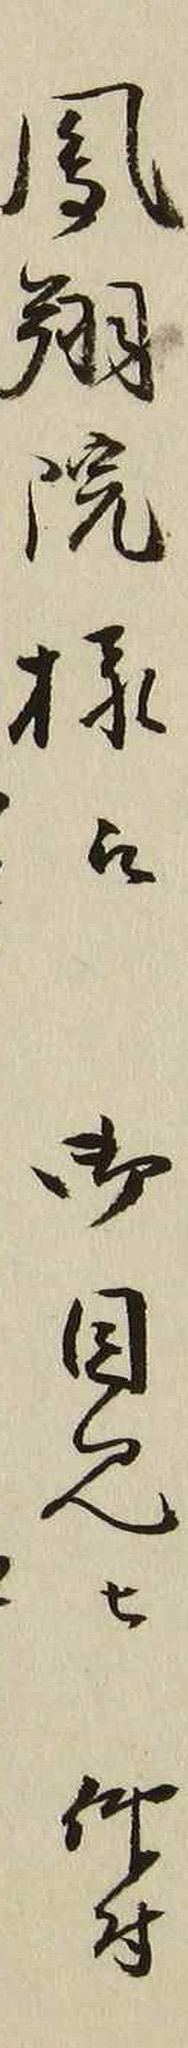鳳翔院様江御目見被仰付
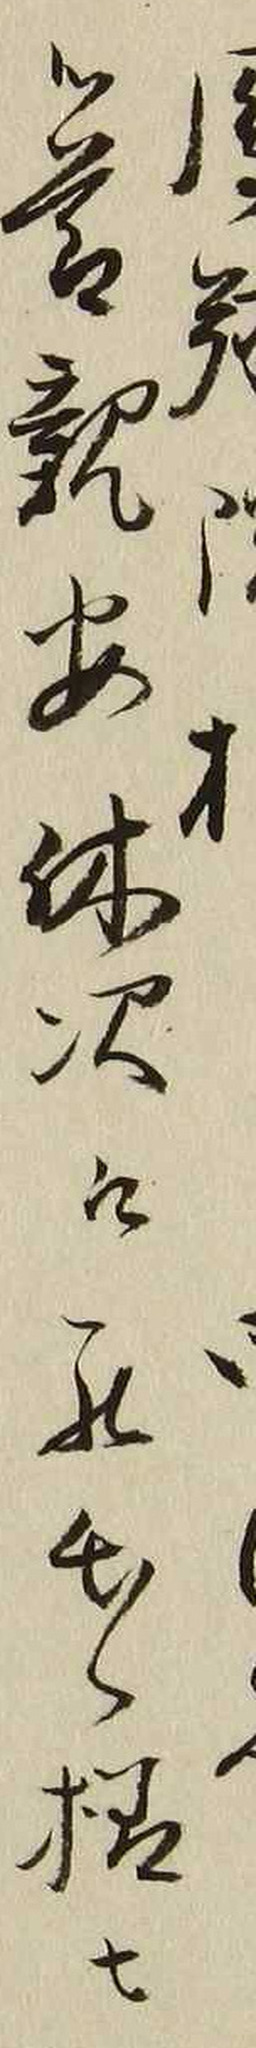候節親安休次江罷出候様被
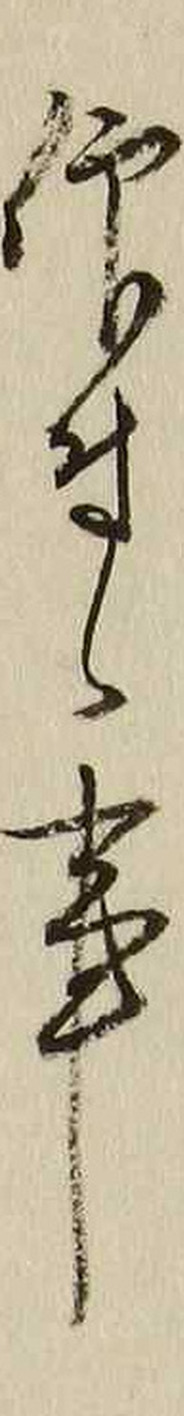仰付候事
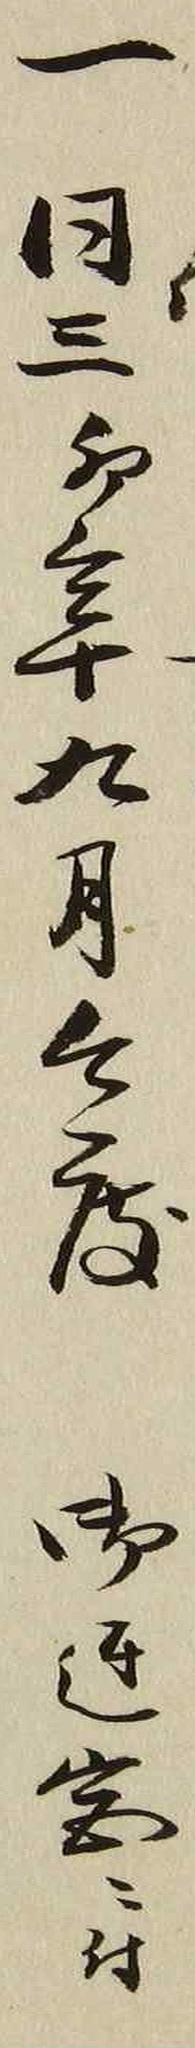一同三卯年九月今度御遷宮ニ付
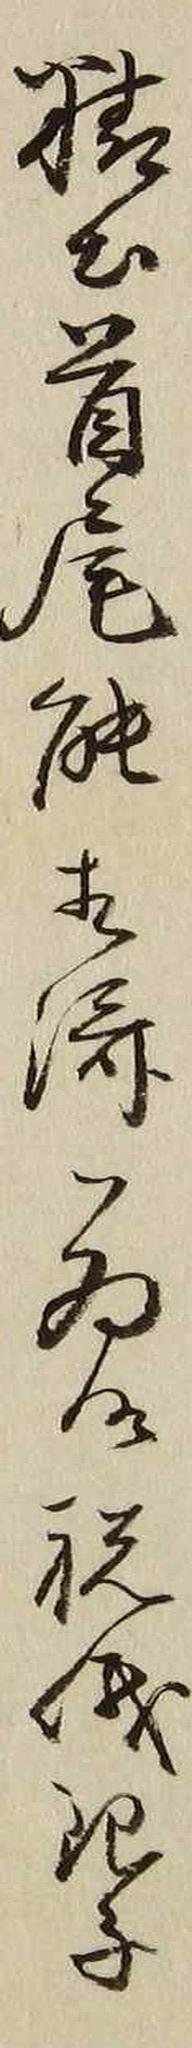精出首尾能相済候為御祝儀銀子
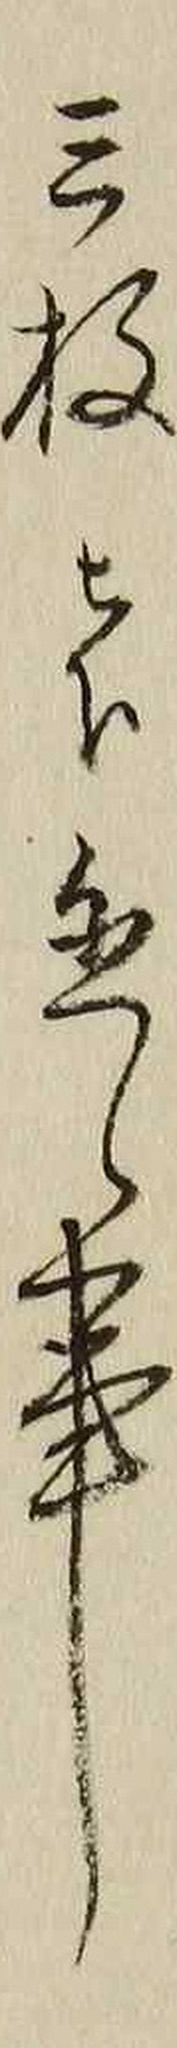三枚被下置候事
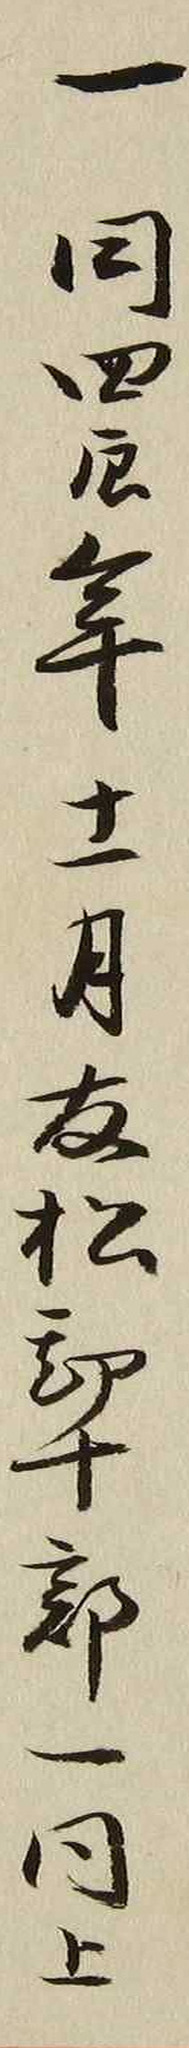一同四辰年十一月友松勘十郎一同上
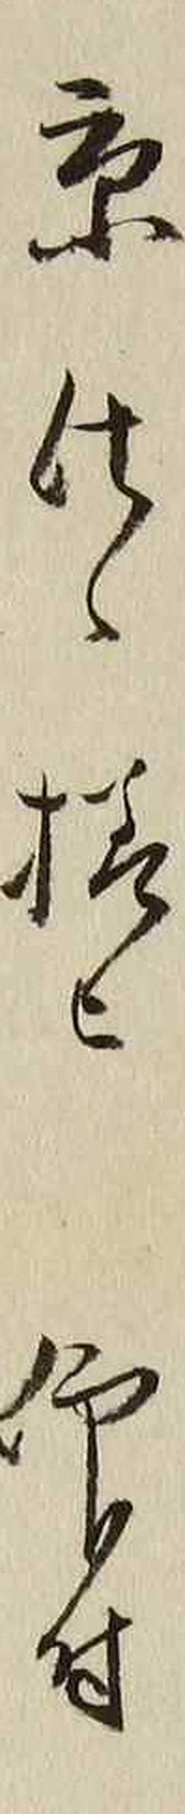京仕候様被仰付
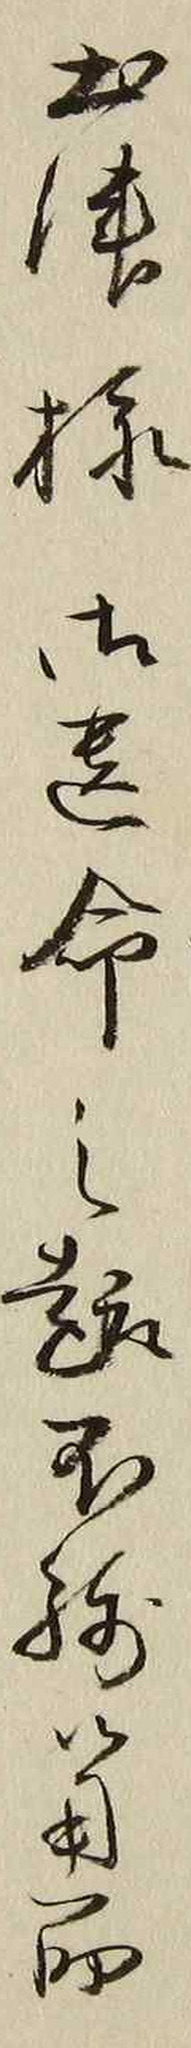土津様御遺命之趣不残御用筋
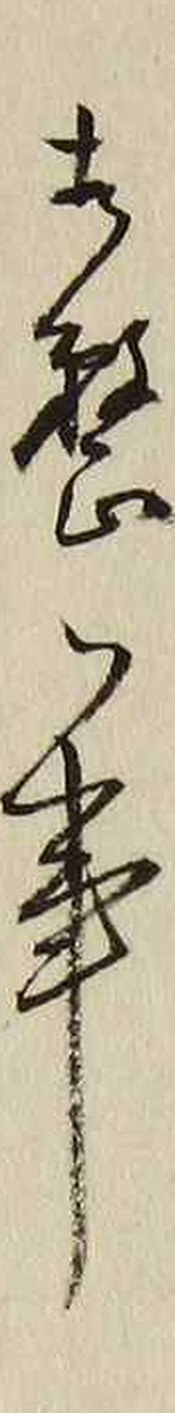相整候事
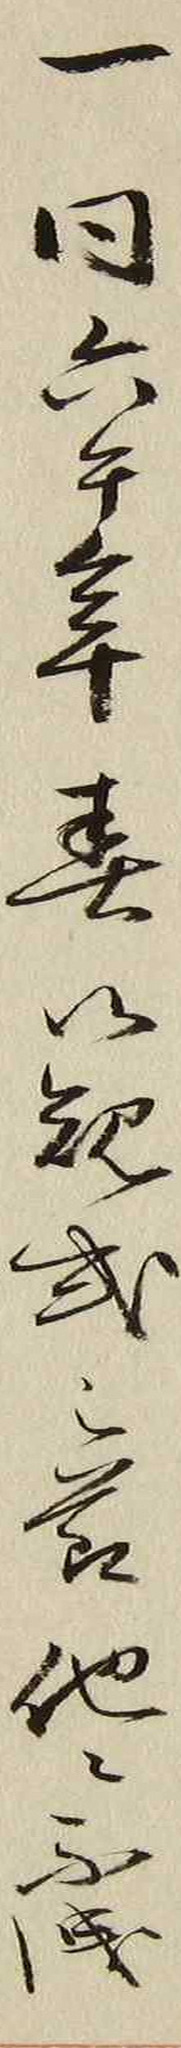一同六午年春御規式之節他ニ不洩
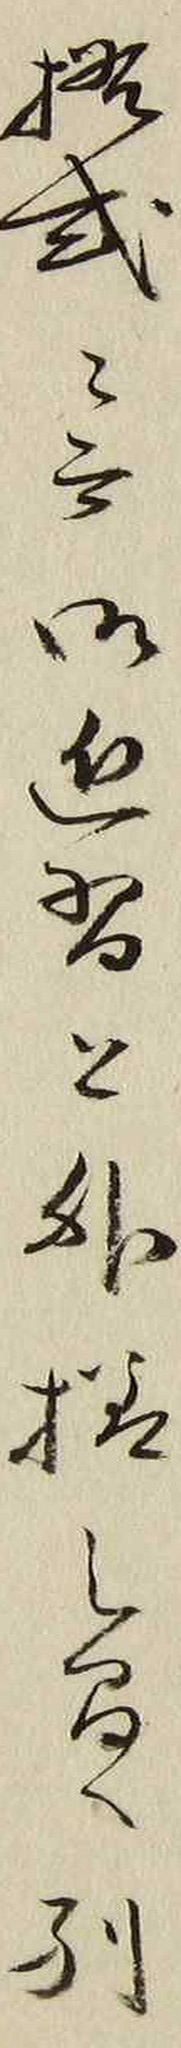格式ニ而御近習と外様之間へ別
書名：諸士系譜　巻之291　さ之部23
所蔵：会津若松市立会津図書館
